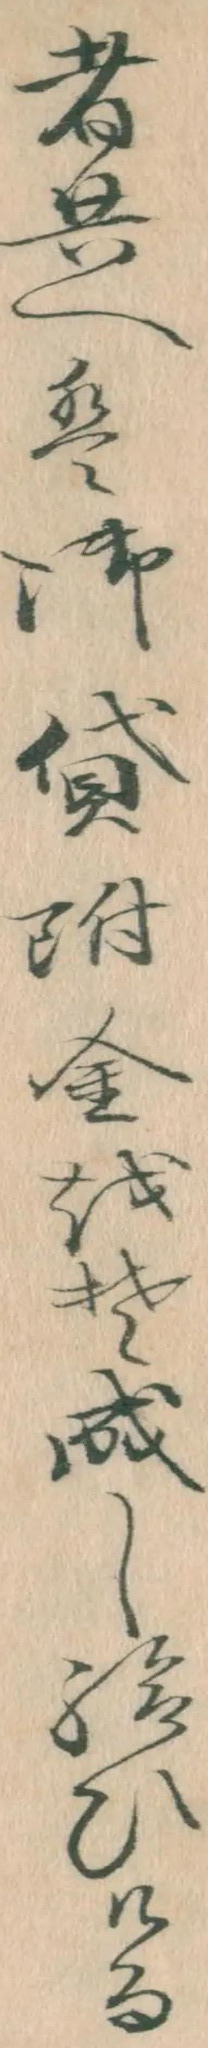者共へは御貸附金をそ成し給ひける
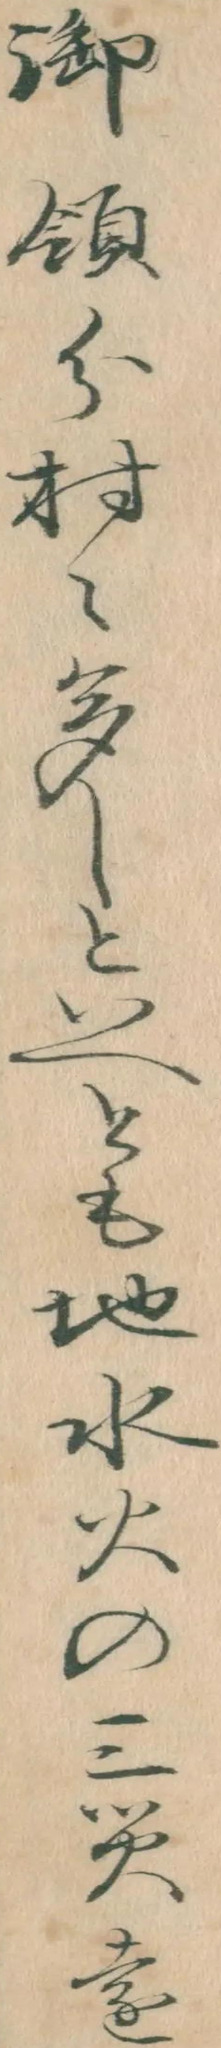御領分村〻多しといへとも地水火の三災を

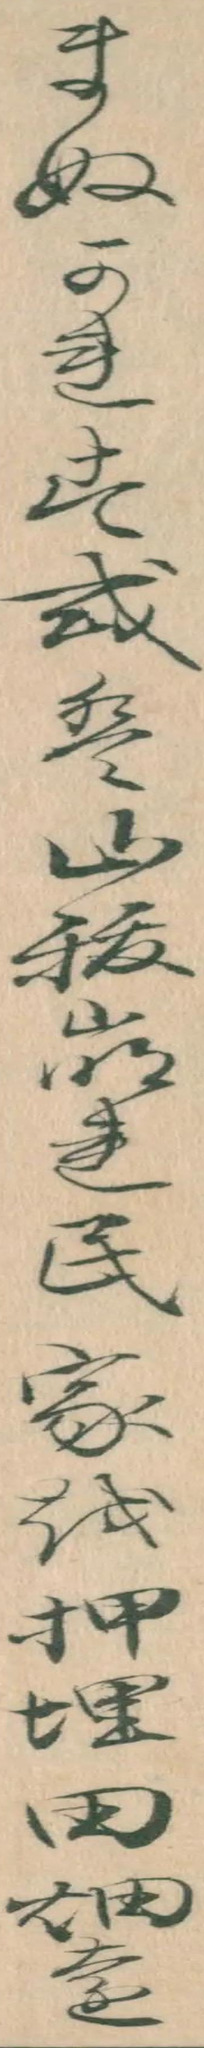まぬかれす或は山抜崩れ民家を押埋田畑を
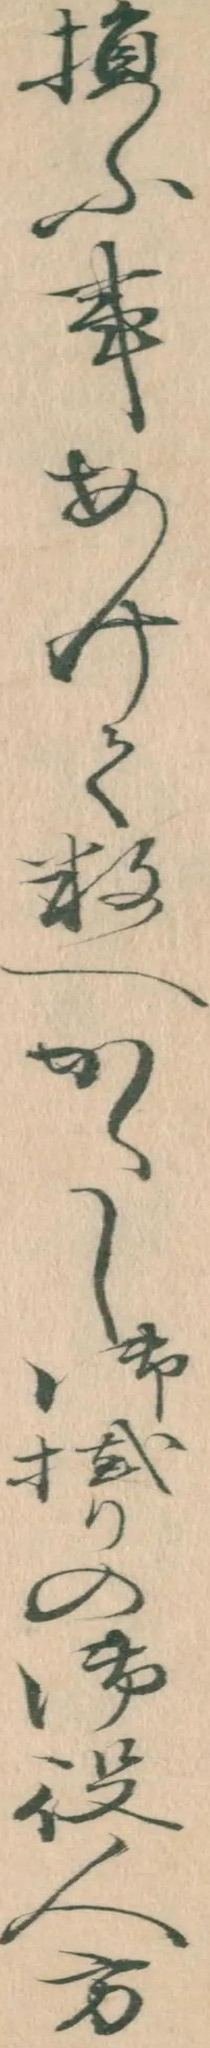損ふ事あけて数へかたし御掛りの御役人方
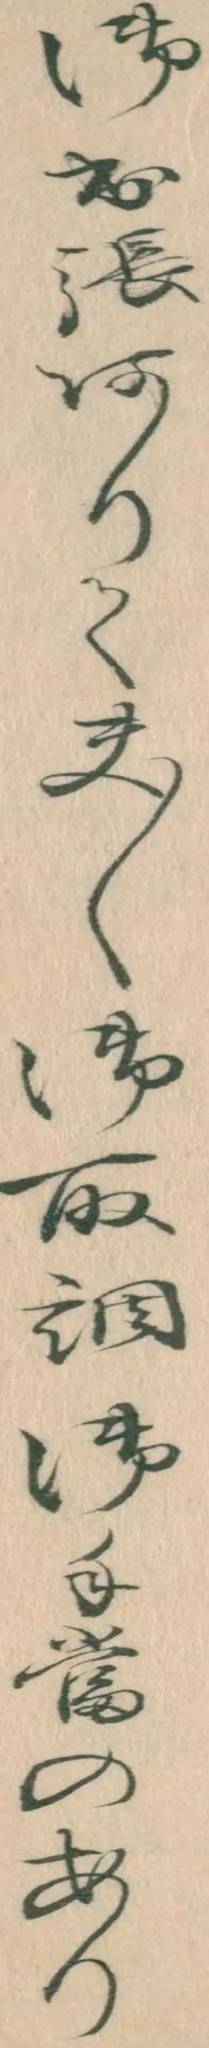御出張ありて夫〳〵御取調御手当のあり
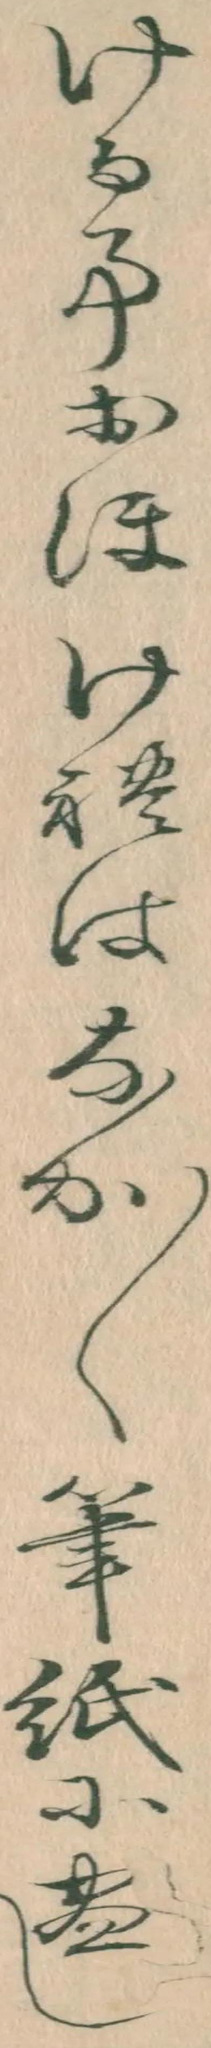ける事おほけれはなか〳〵筆紙に尽し
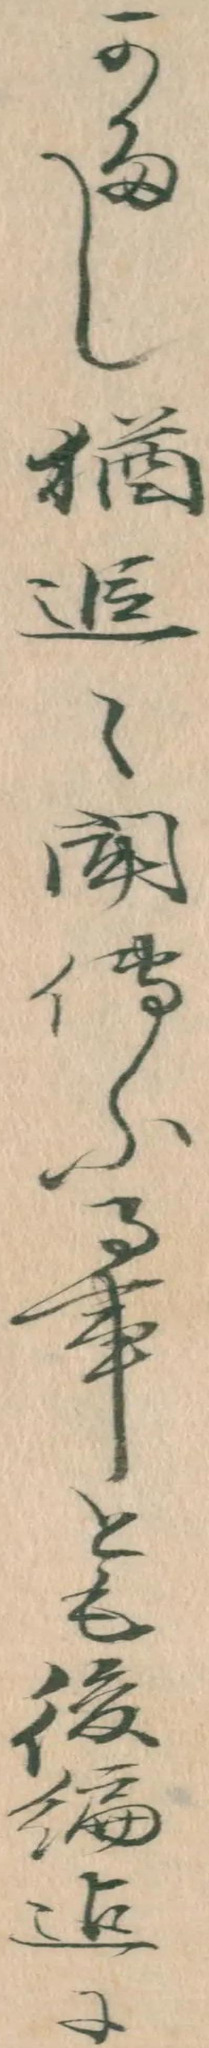かたし尚追〻聞伝ふる事とも後編迄に
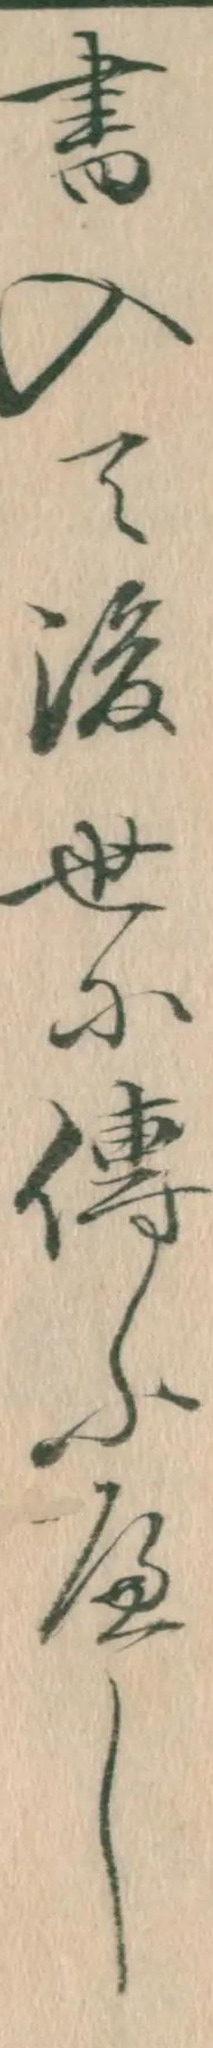書入て渡世に伝ふへし
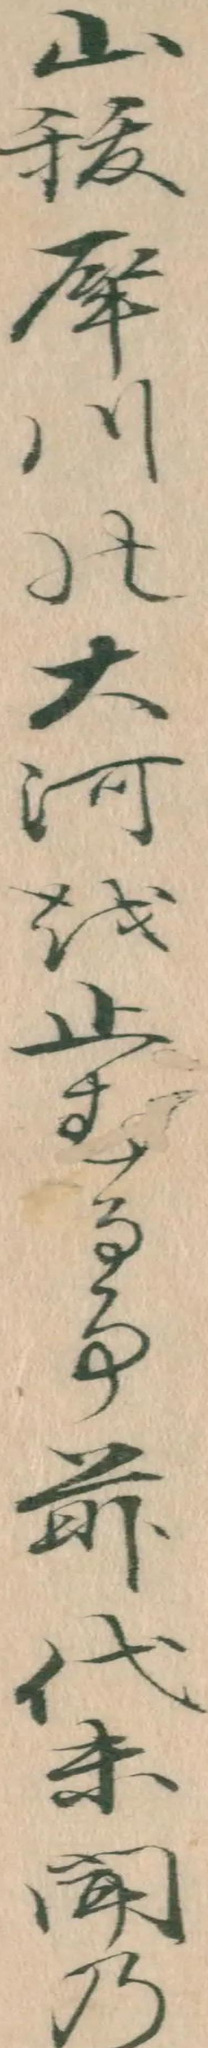山抜犀川の大河を止むる事前代未聞の
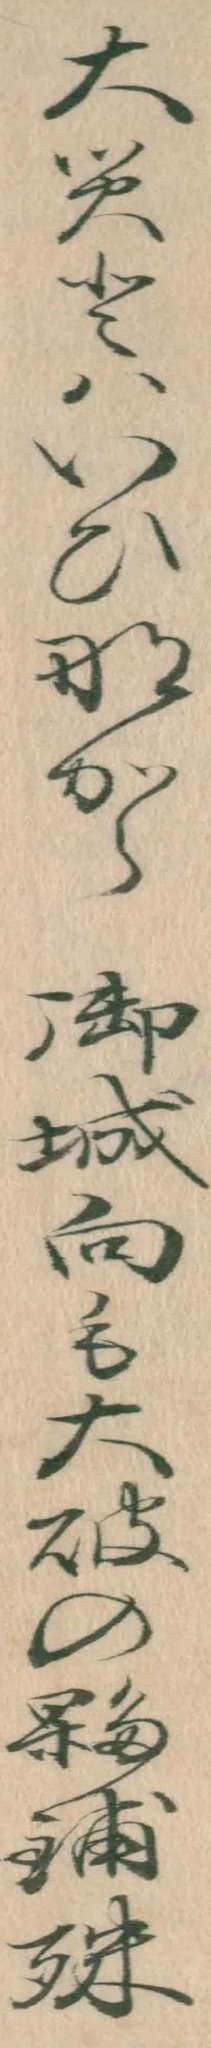大災とはいひなから御城向も大破の夥鋪殊
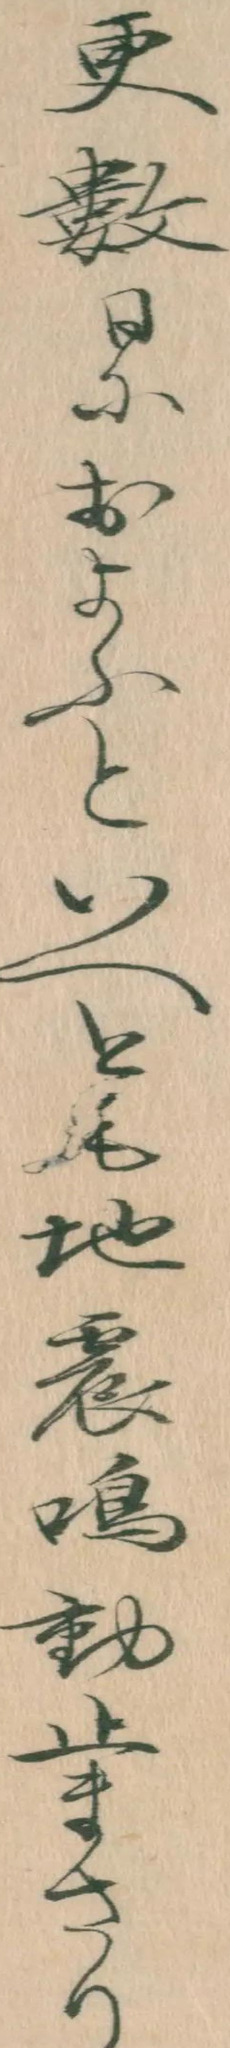更数日におよふといへとも地震鳴動止まさり
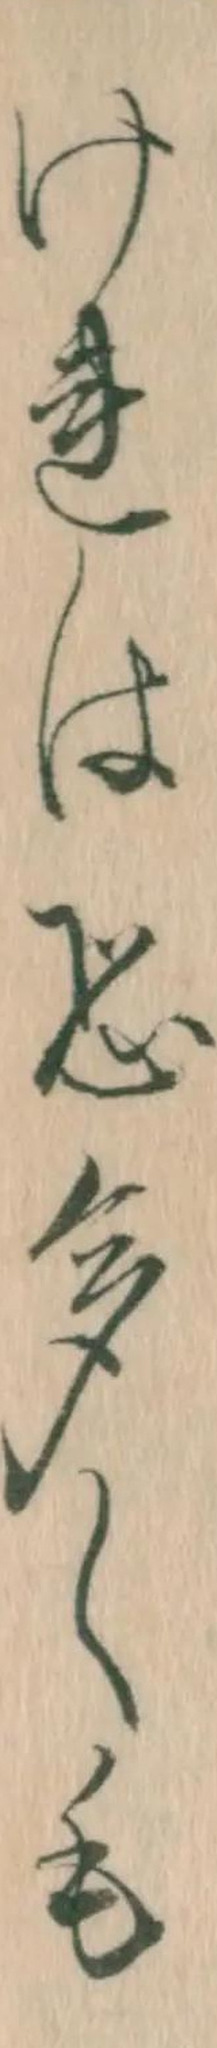けれは恐れ多くも
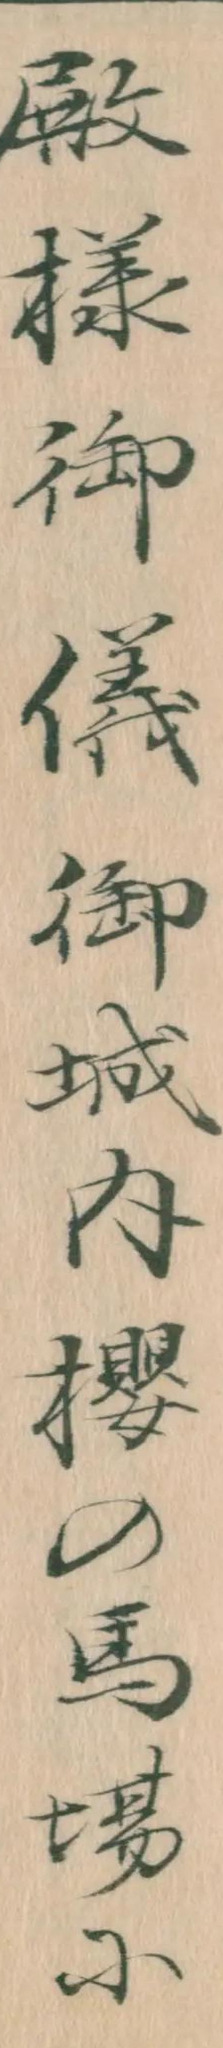殿様御儀御城内桜の馬場に
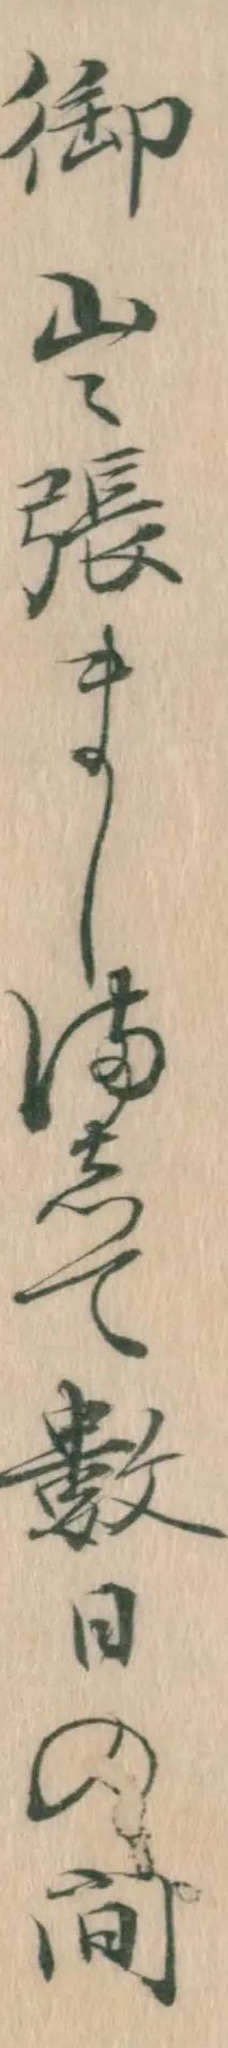御出張ましまして数日の間
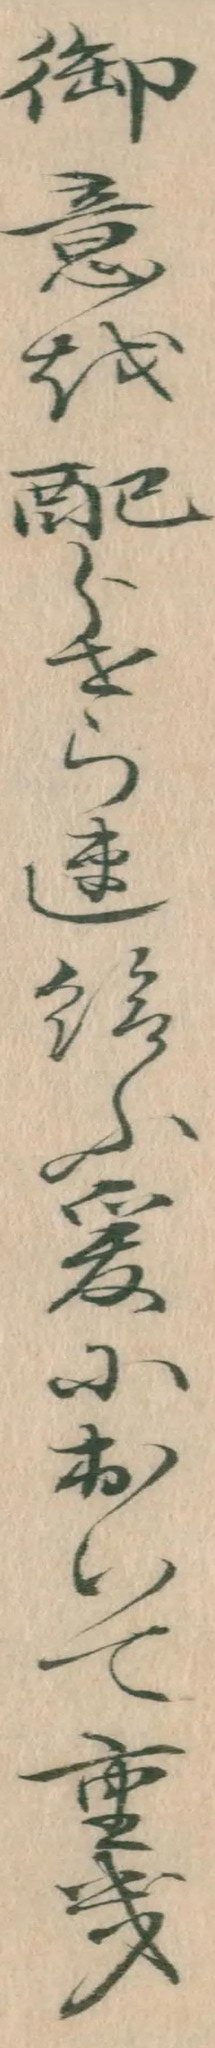御意を配らせられ給ふ爰において重き
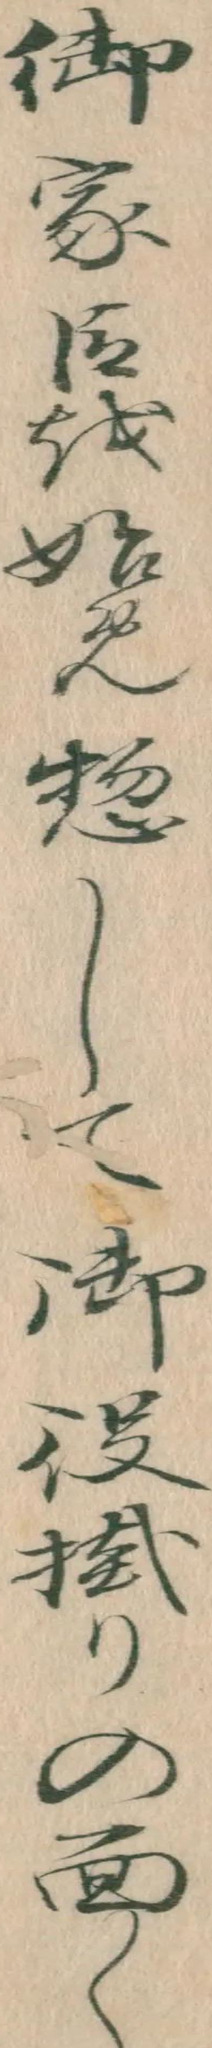御家臣を始め惣して御役掛りの面〳〵
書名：俗語之種. [6]
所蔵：国立国会図書館 National Diet Library, JAPAN
